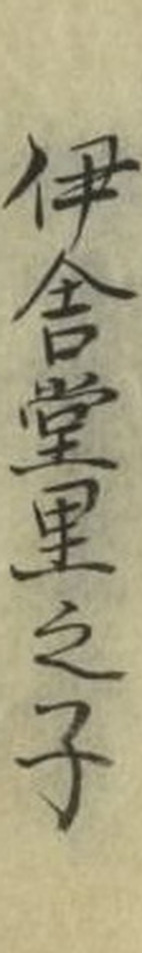管伊舎堂里之子
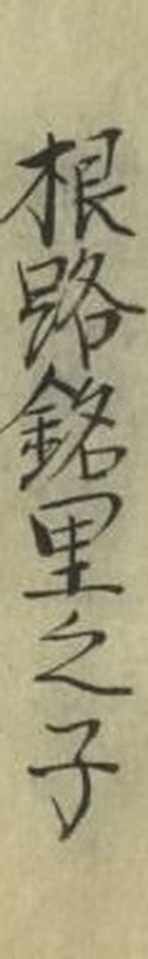三金根路銘里之子
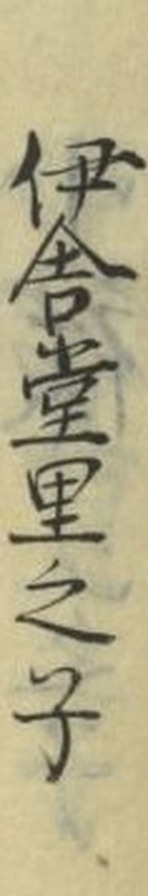管伊舎堂里之子
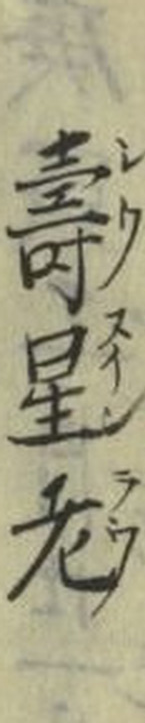寿星老
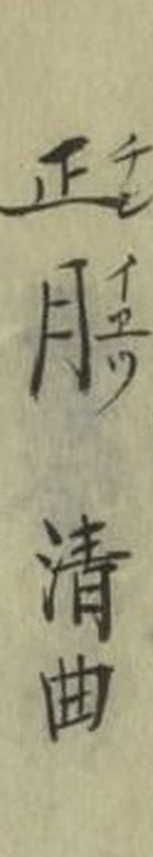正月清曲
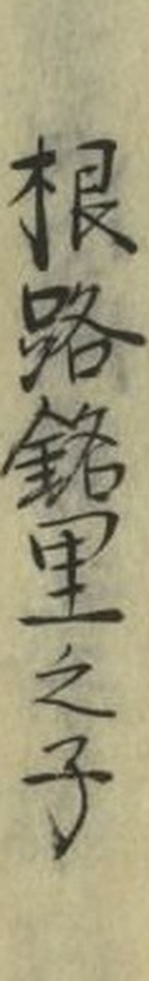三金根路銘里之子

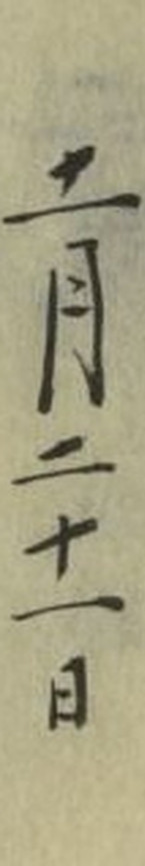十一月二十一日
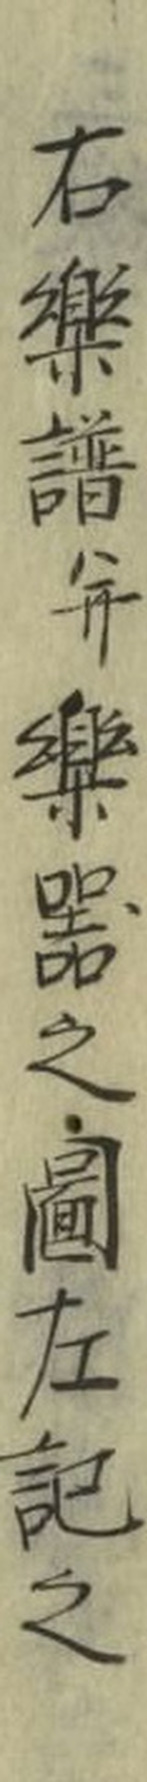右楽譜幷楽器之図左記之
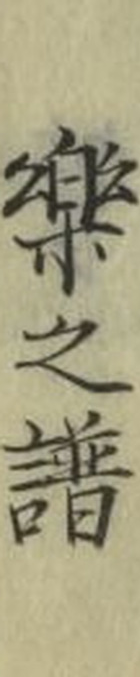楽之譜
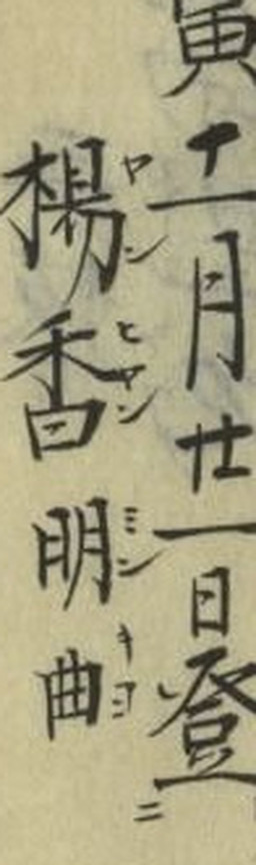楊香明曲
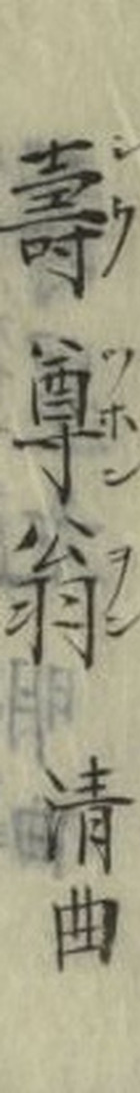寿尊翁清曲
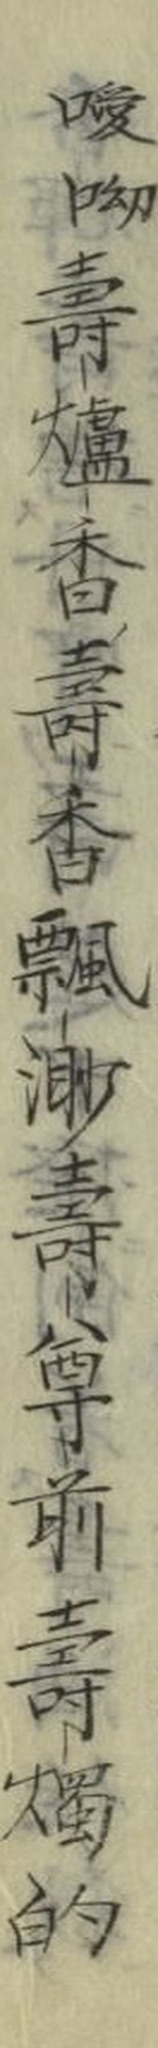噯呦寿-爐-香寿-香飄-渺寿-尊-前寿-燭的

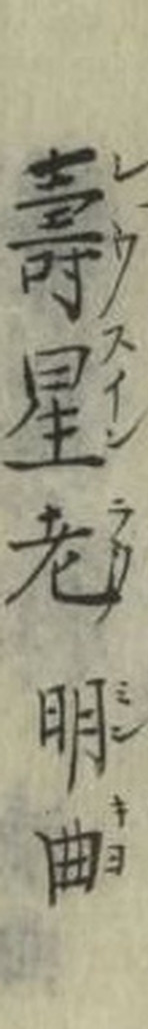寿星老明曲
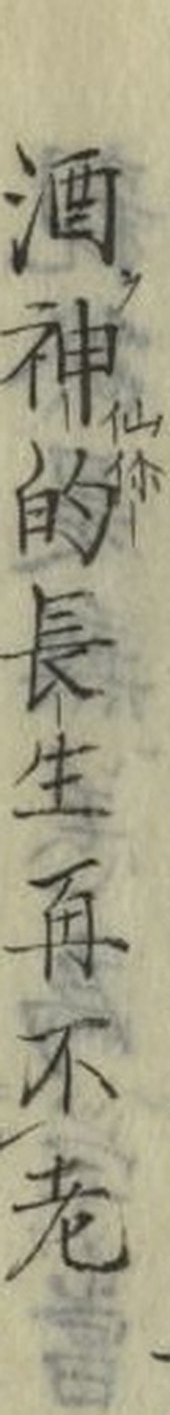酒神-仙儞-的長-生再不老
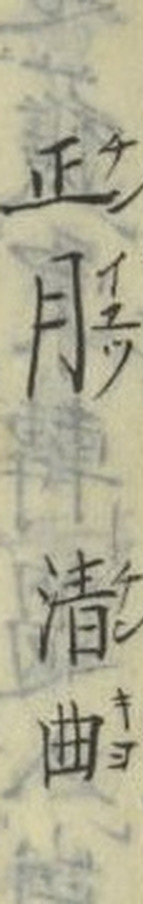正月清曲
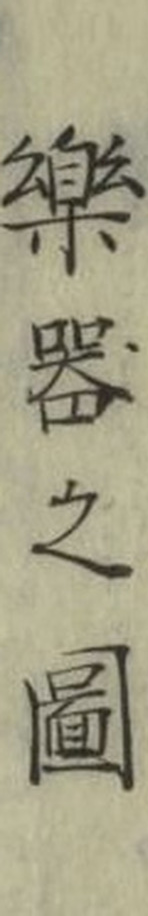楽器之図
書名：宝永七庚寅年琉球国来聘使日記
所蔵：University of the Ryukyus Library
